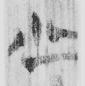少
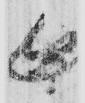臣
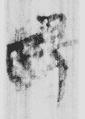{女𡵂}
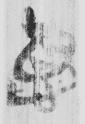惪
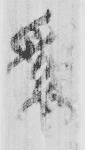奚
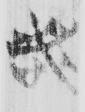若
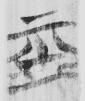亞
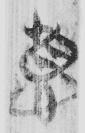惪
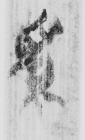奚
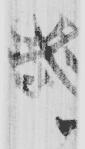若
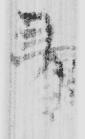𡵂
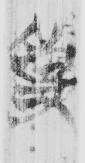事
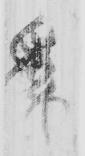奚
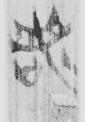若
